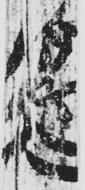○（刁）
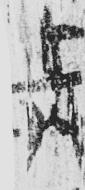與（與）
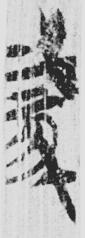○（易）
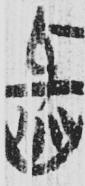○（牙）
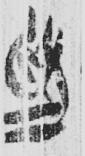爲
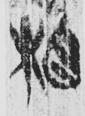相
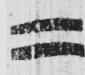二
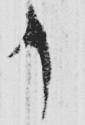人
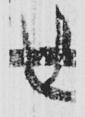也
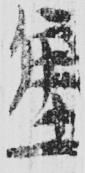○（朋）
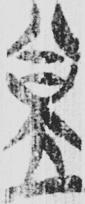堂（黨）
